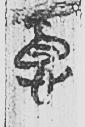惪
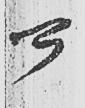乃
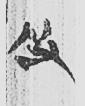及
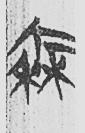秦
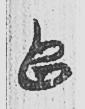𠂤
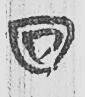回
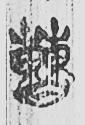曹
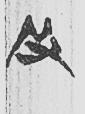及
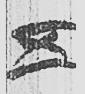五
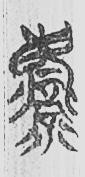{鹿彔}
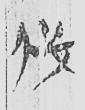伐
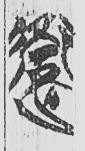{衛止}
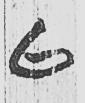㠯（以）
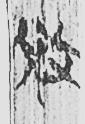敓
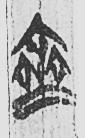齊
